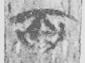百
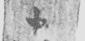十
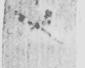五
